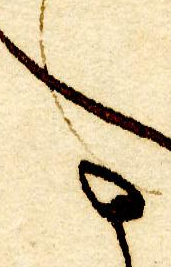To
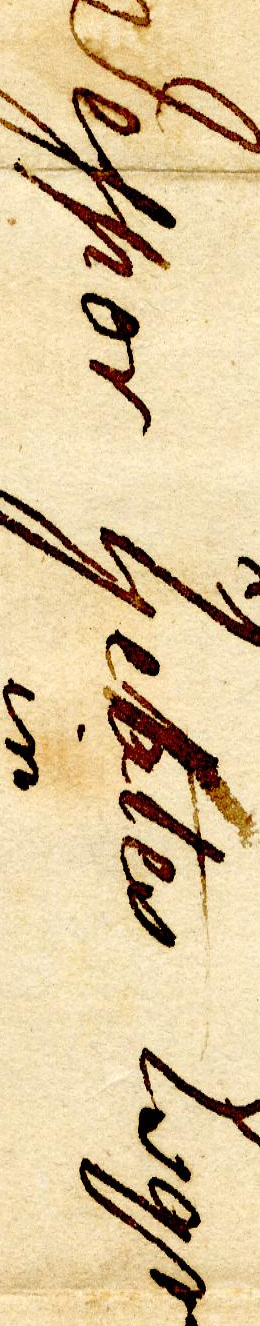Jespor Yeates Esqr
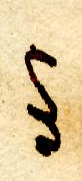in
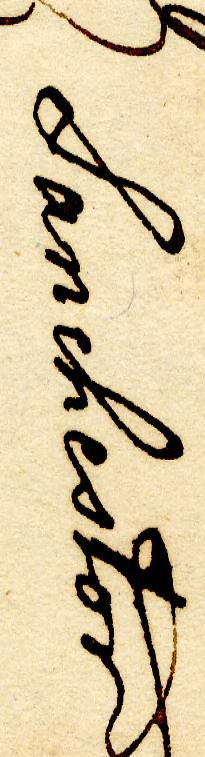Lanchestor
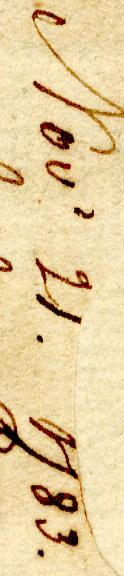Nov^r 21. 1783.
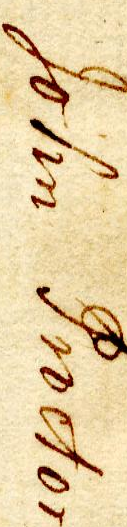John Proctor
